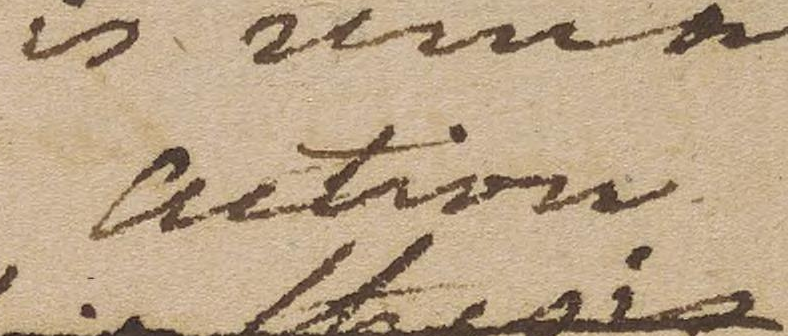actions
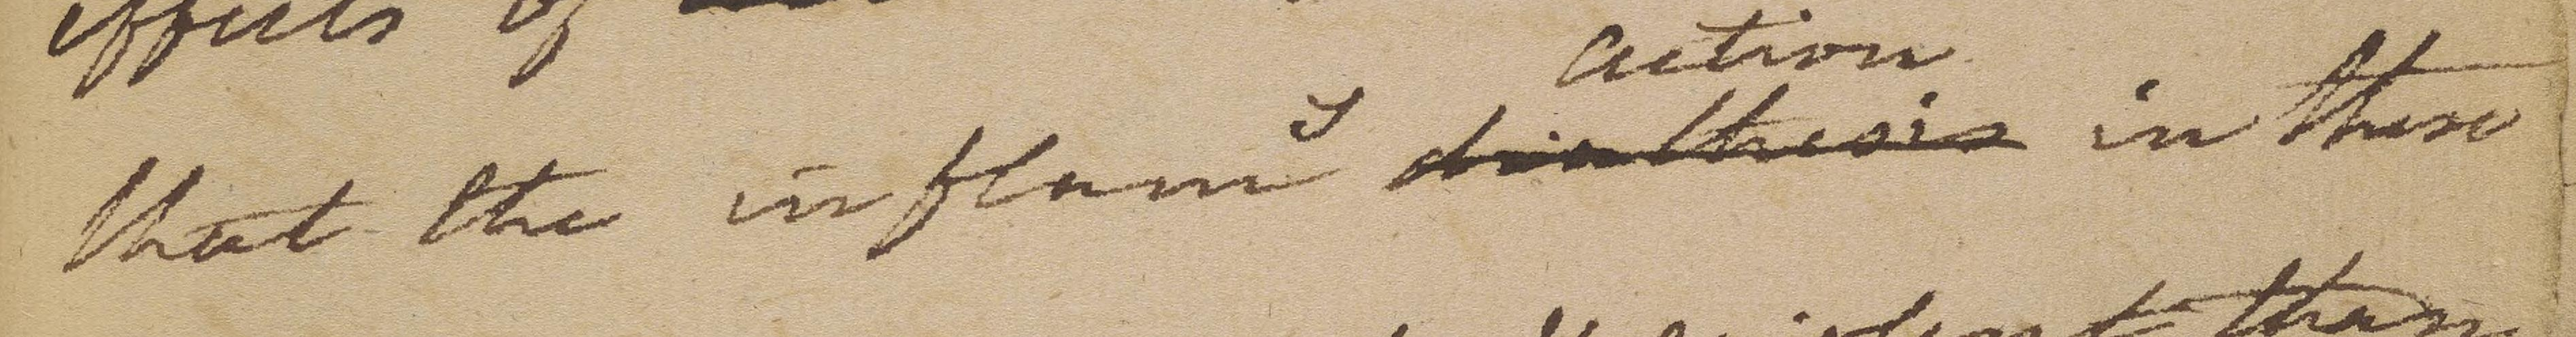that the inflam^y [__________] in these
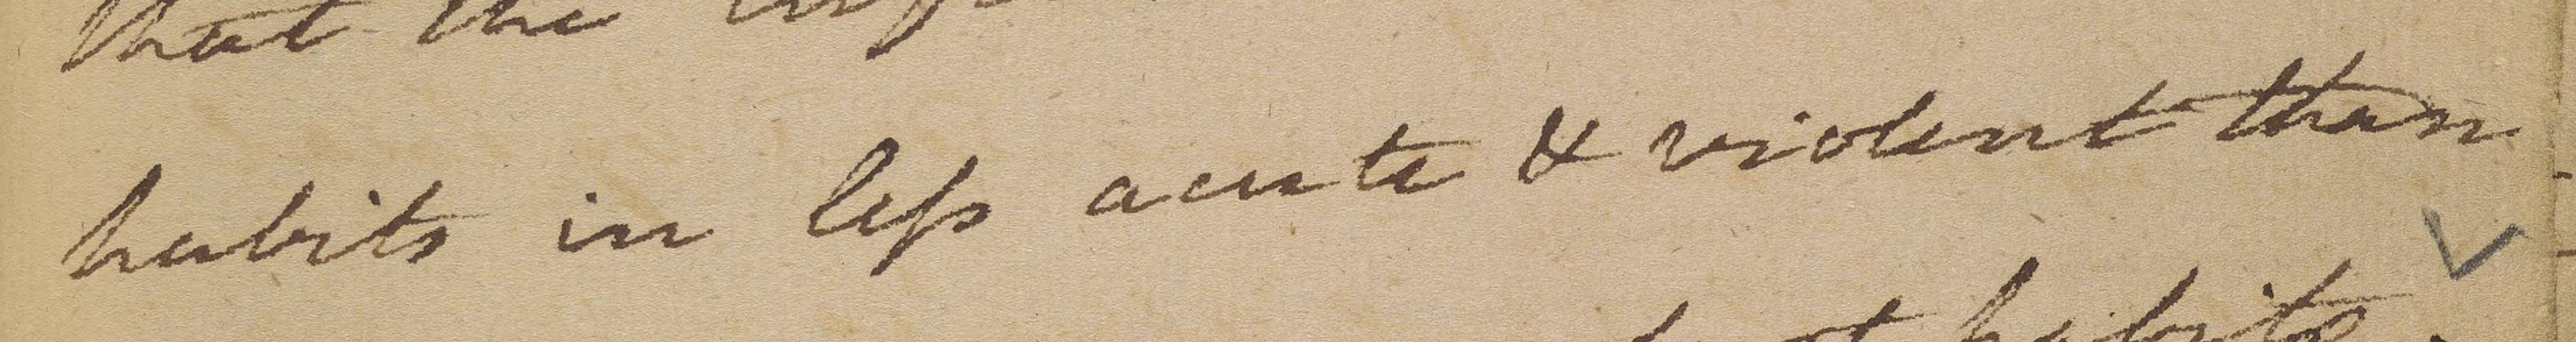habits is less acute & violent than
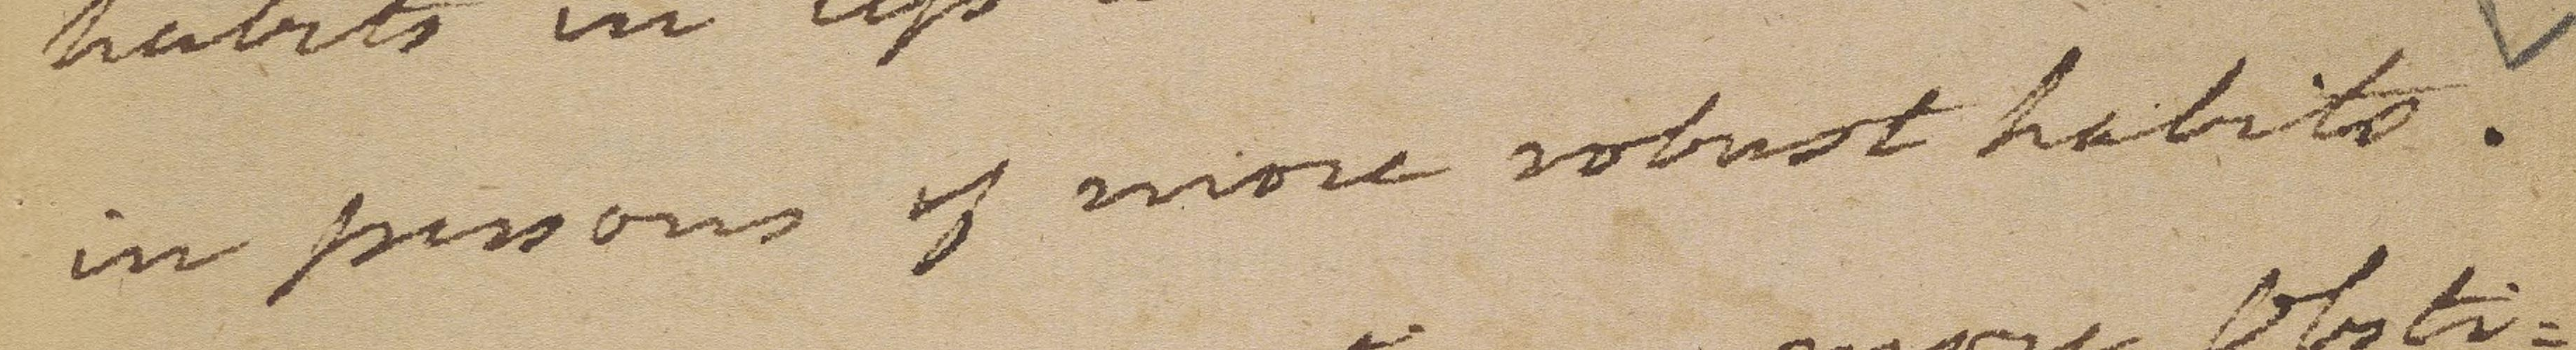in persons of more robust habits. V
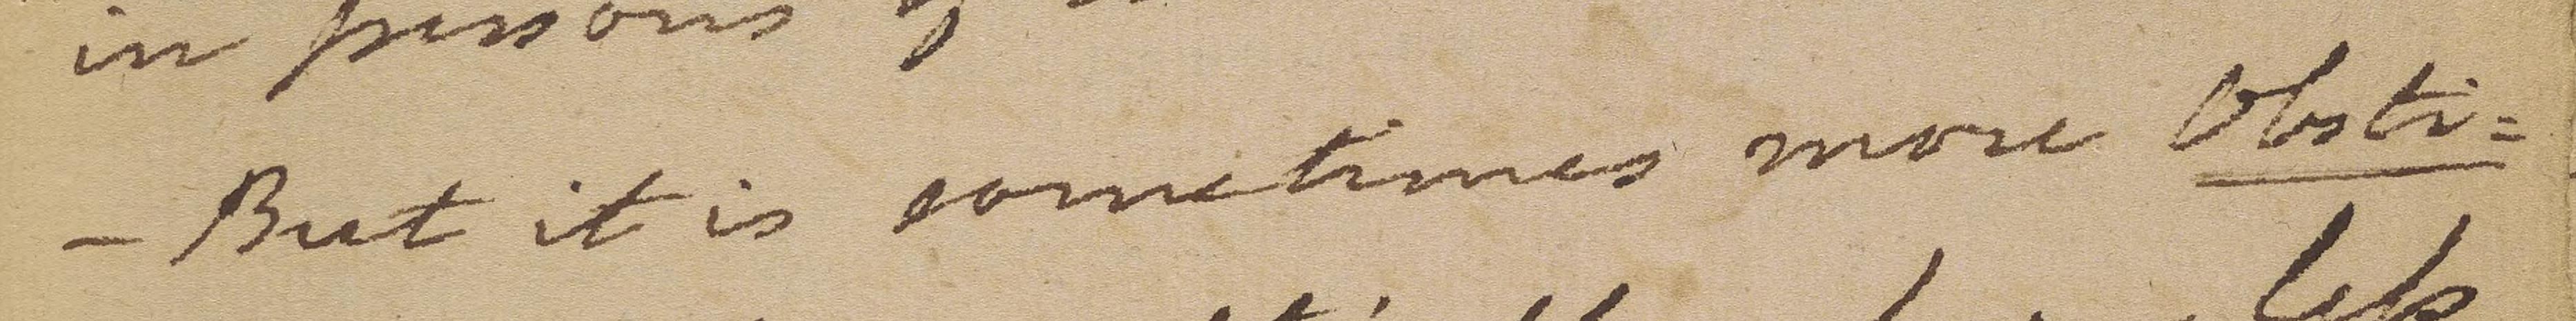- But it is something more obsti-
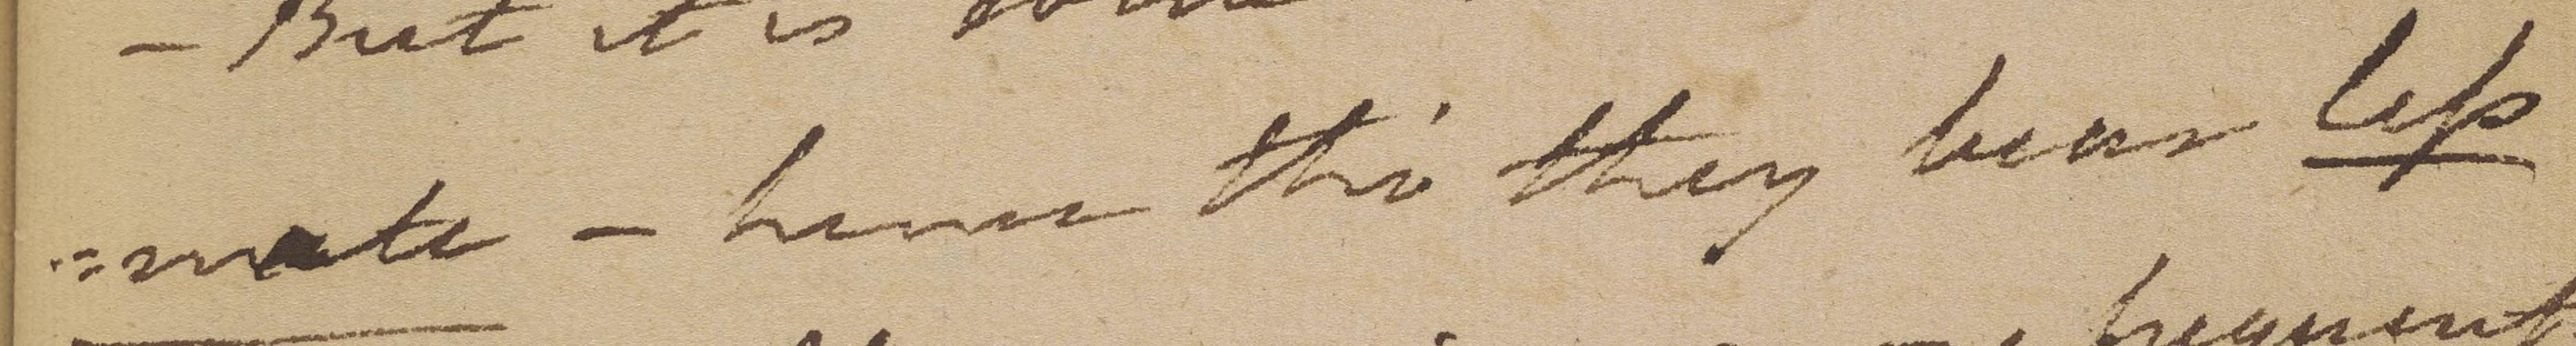-nate- hence tho' they bear less
